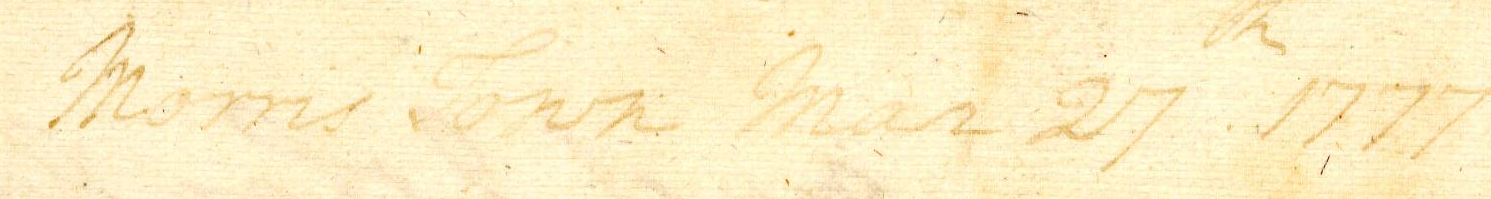Morris Town Mar 27^th 1777
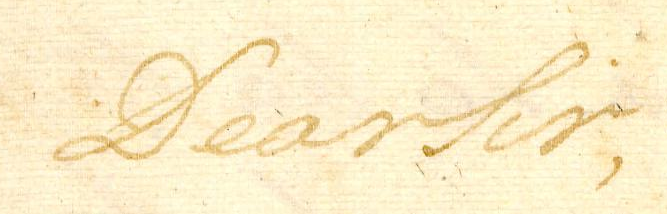Dear Sir,
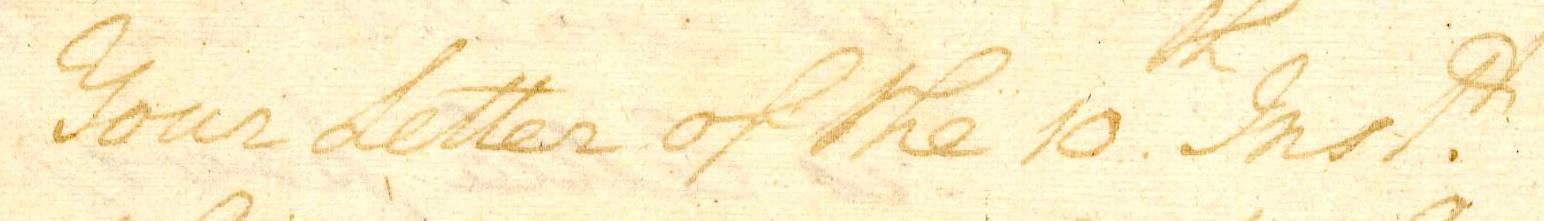Your Letter of the 10^th Inst^t.
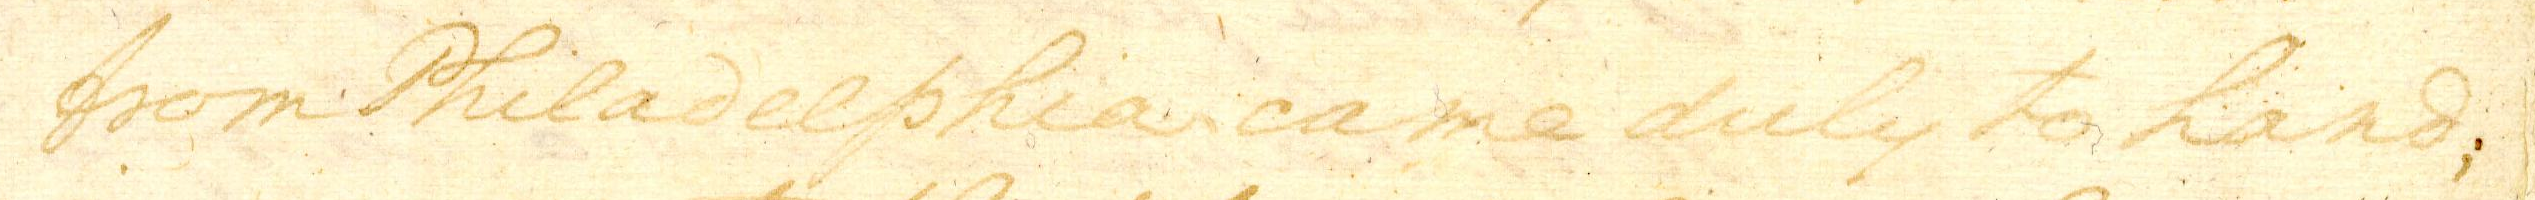from Philadelphia came duly to hand;
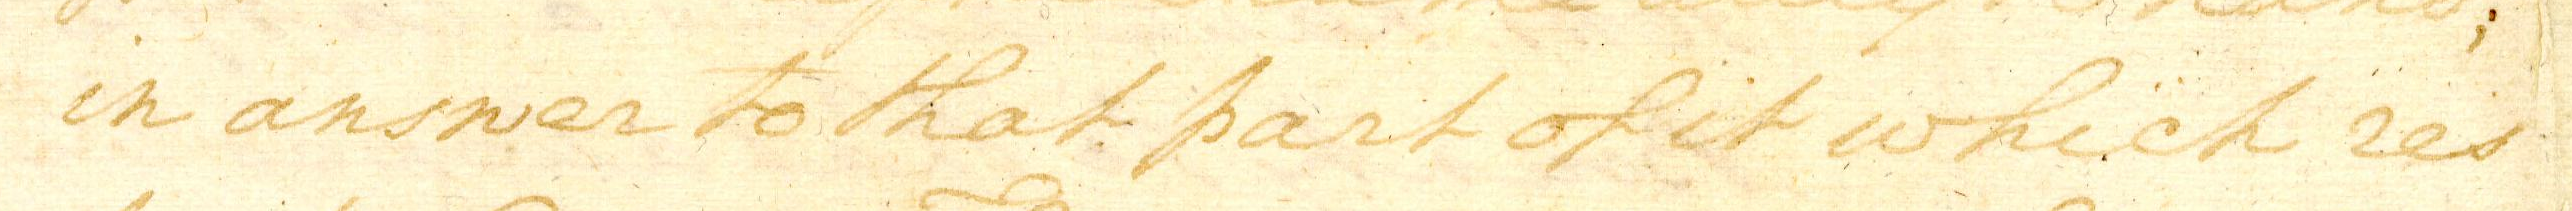in answer to that part of it which res
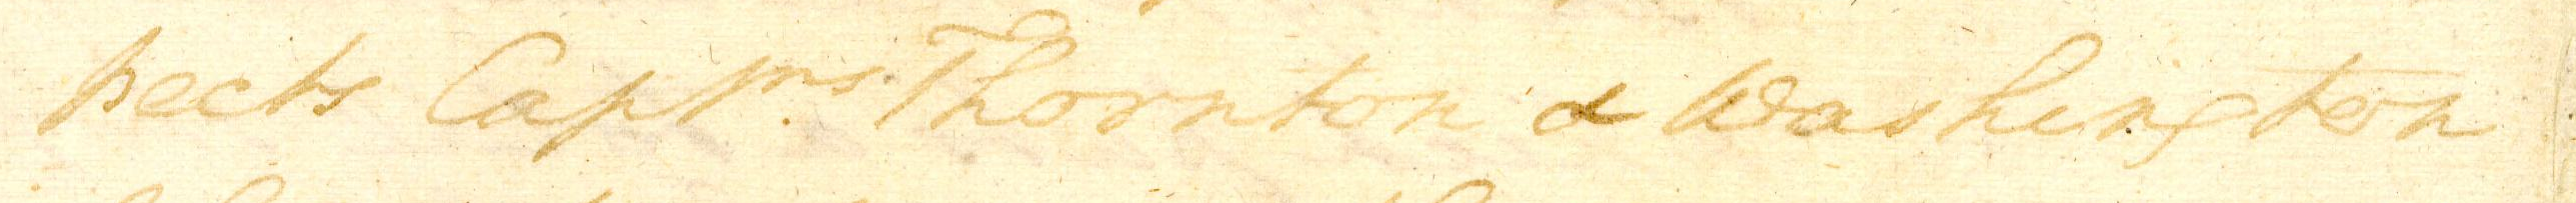pects Capt^ns Thornton & Washington
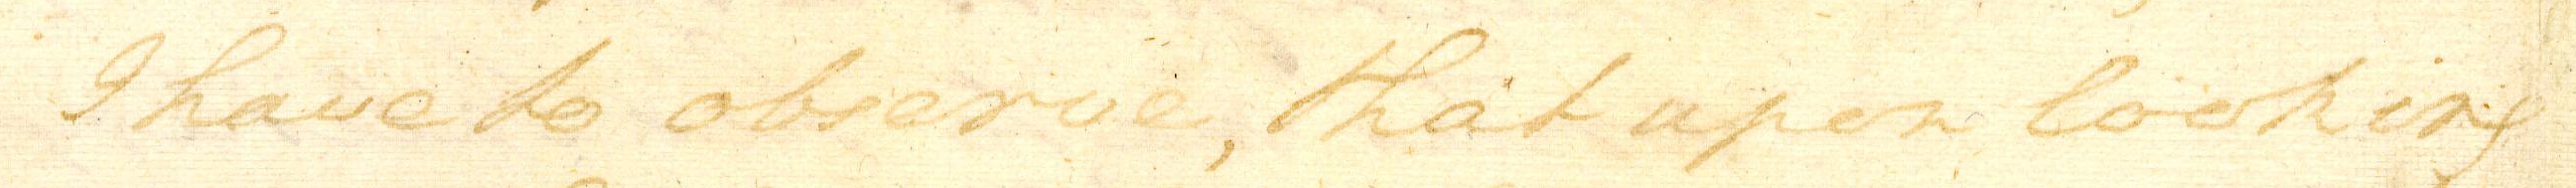I have to observe, that upon looking
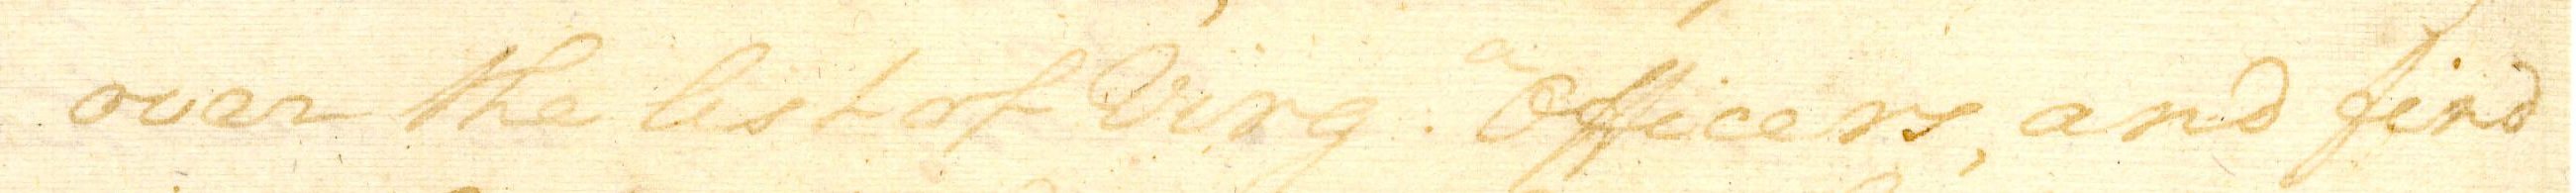over the list of Virg. Officers, and find
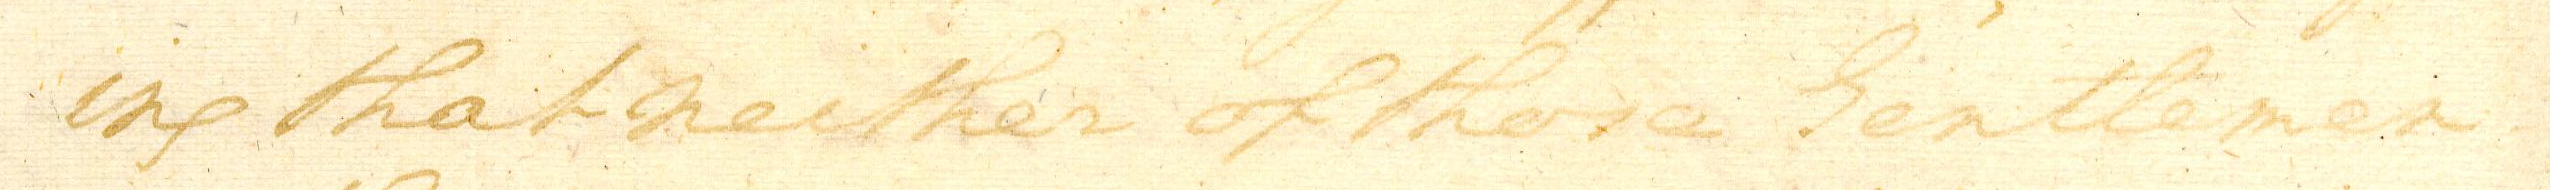ing that neither of these Gentlemen
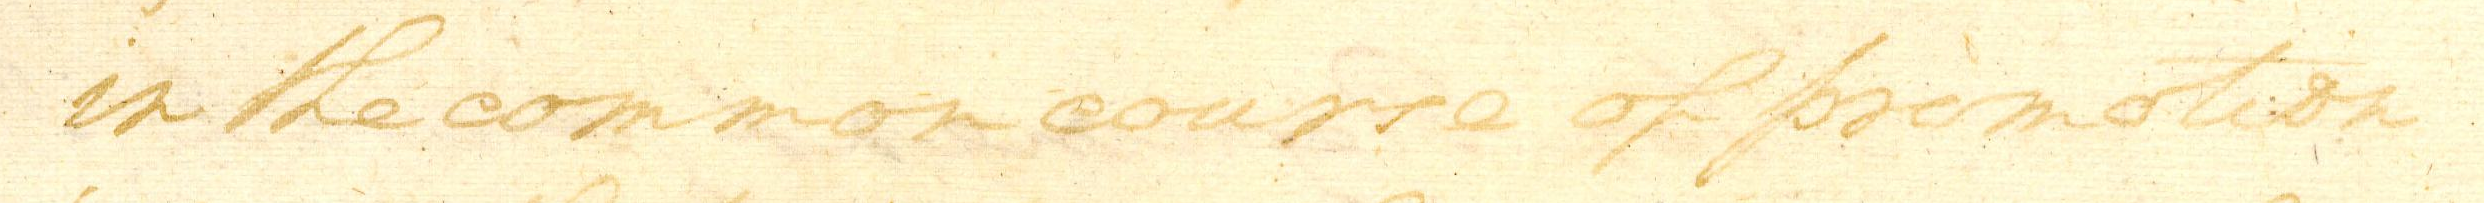in the common course of promotion
